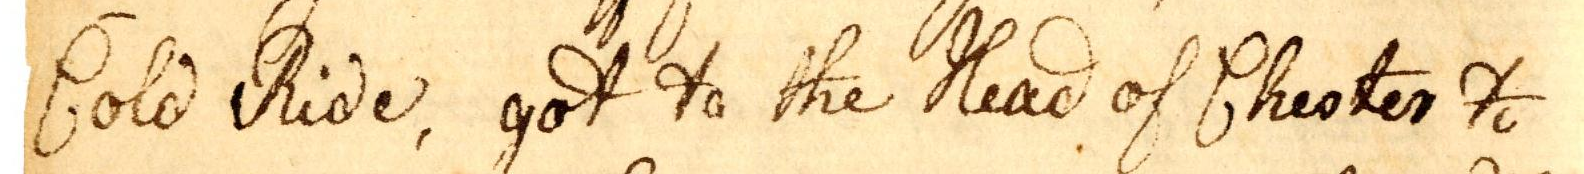Cold Ride, got to the Head of Chester to
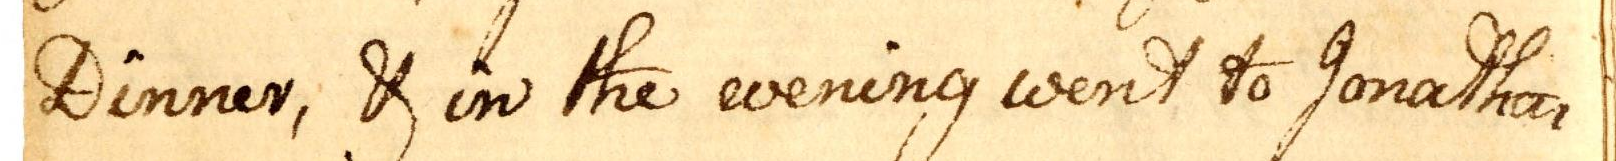Dinner, & in the evening went to Jonathan
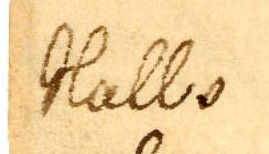Halls
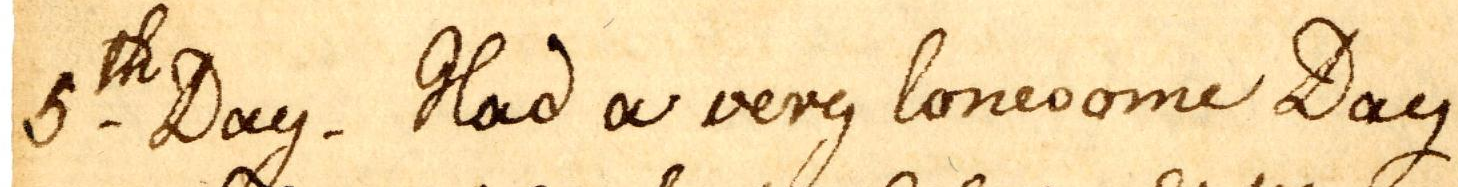5^th Day- Had a very lonesome Day
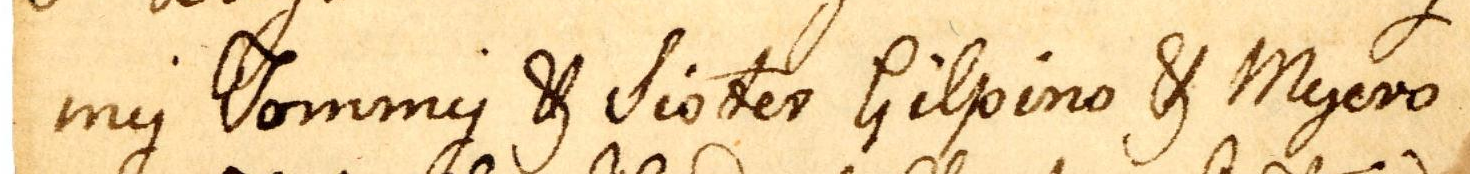my Tommy & Sister Gilpins & Myers
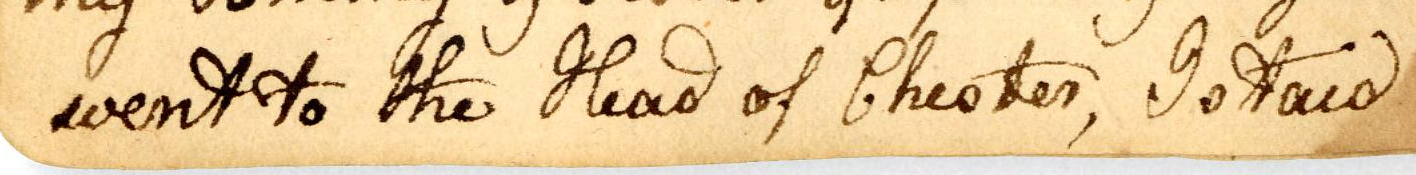went to the Head of Chester, I staid
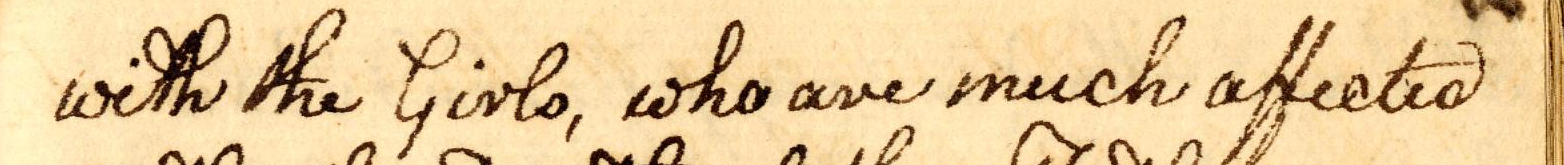with the Girls, who are much affected
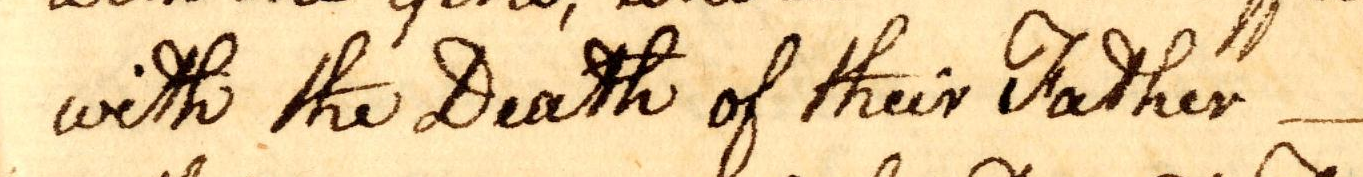with the Death of their Father
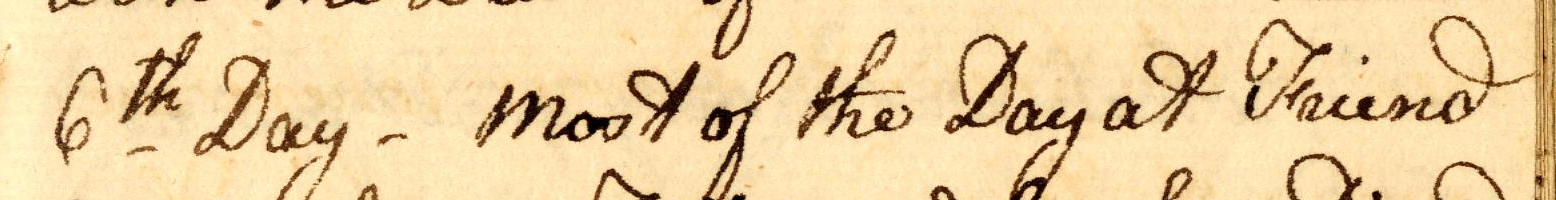6^th Day- most of the Day at Friend
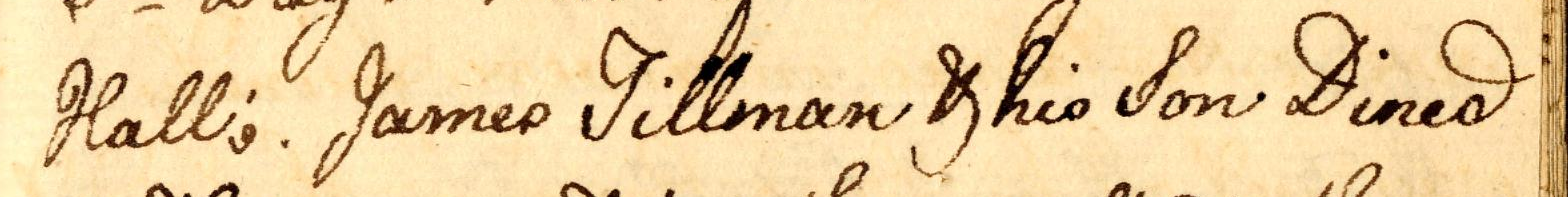Hall's. James Tillman & his Son Dined
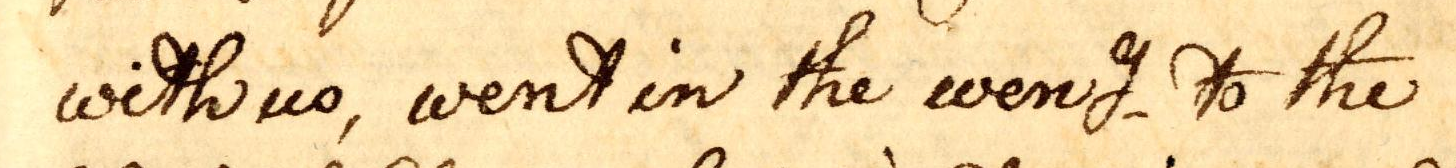with us, went in the even^g to the
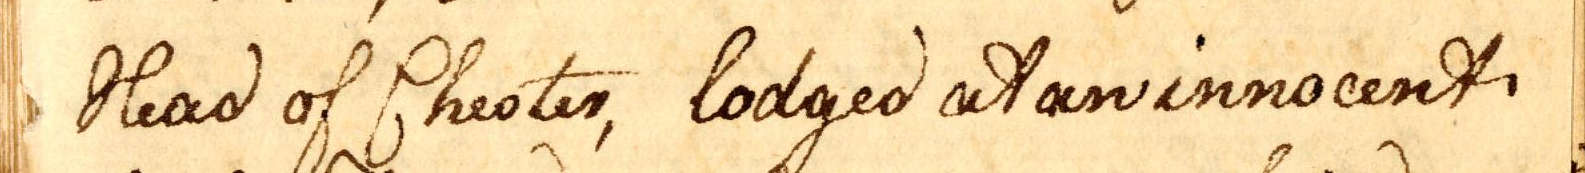Head of Chester, lodged at an innocent
